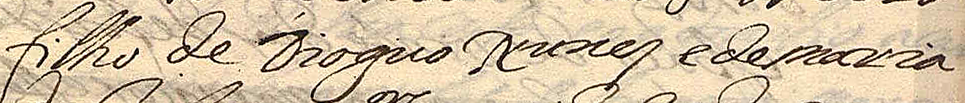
filho de Dioguo Nunez e de maria
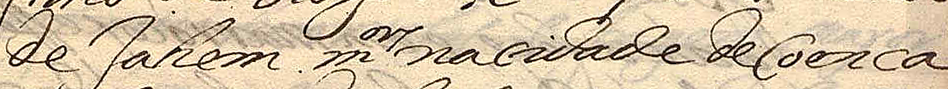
de Jahem mors na cidade de Coenca
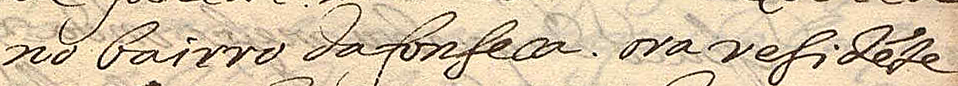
no bairro da fonseca. ora residēte
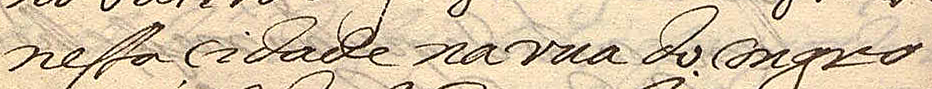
nesta cidade na rua do congro
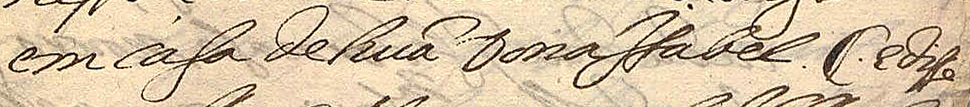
em casa de huā Dona Jsabel ⁋ E disse
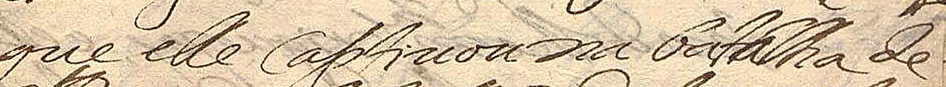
que elle captiuou na batalha de
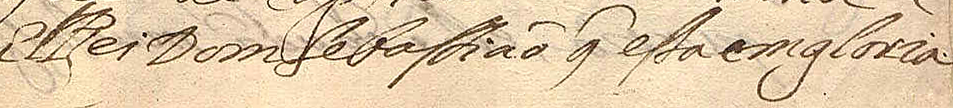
El Rei Dom Sebastiaõ q̄ esta em gloria
